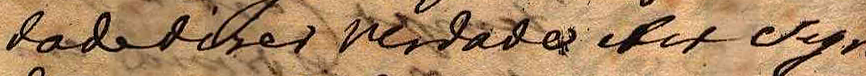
dado dizer Verdade e ter segre
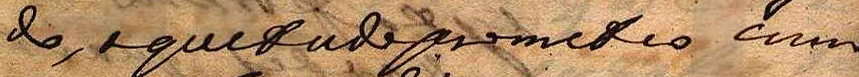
do, o que tudo prometeo cum
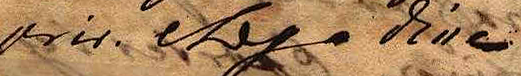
prir. e Logo disse.
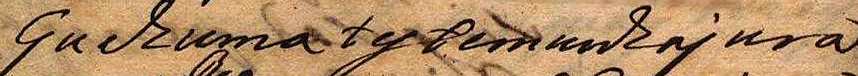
Que huma testemunha jura
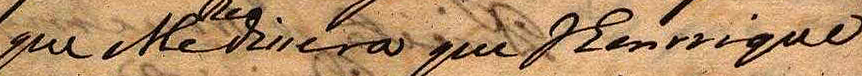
que elle Reo dissera que Henrrique
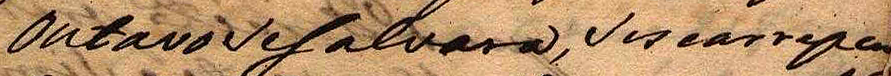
Outavo se salvara, se se arrepen
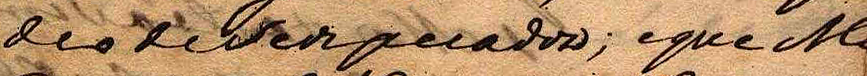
deo de seoz pecadoz; e que elle
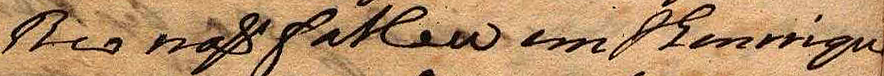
Reo naõ fallou em Henrriqu
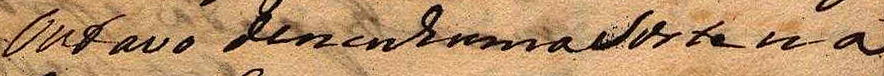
Outavo de nenhuma sorte na
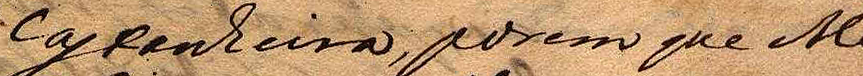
Castanheira, porem que elle
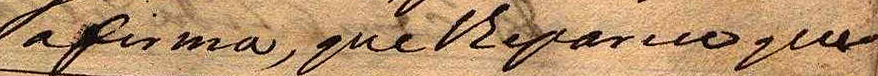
afirma, que lhe pareceo que
